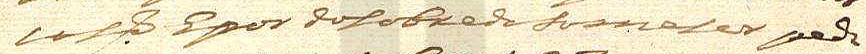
casaõ E por do sobredito me ser pedi
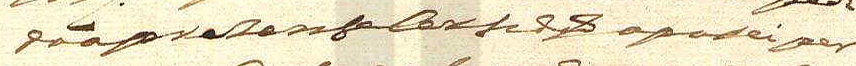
da a prezente Certidaõ a pasei per
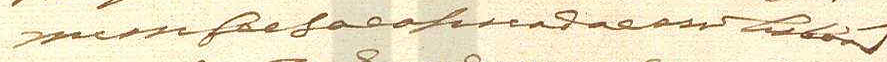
mim feita e asinada em Lisboa
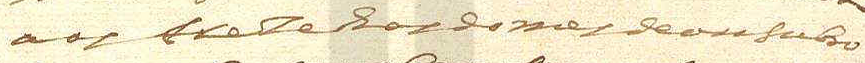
aos treze dias do mes de outubro
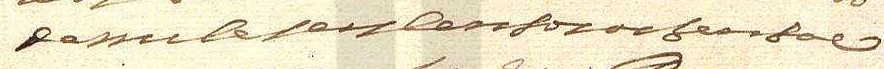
de mil e seiscentos oitenta e
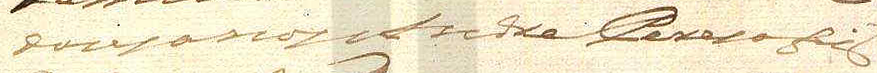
dous anos Andre Peres a fis
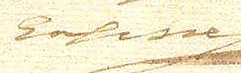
E asinej
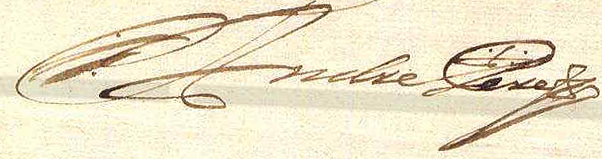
Andre Peres
